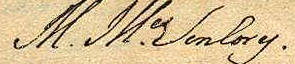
M. Ill.es Senhores.
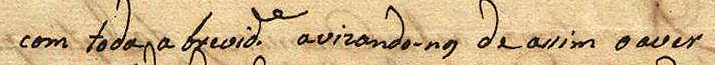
com toda a brevid.e avizando-nos de assim o aver
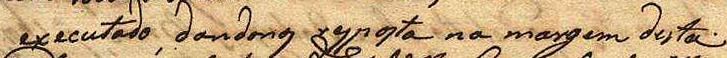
executado, dandonos resposta na margem desta
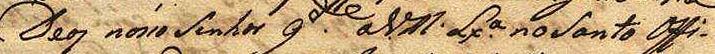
Deos nosso Senhor g.de a VM. Lx.a no Santo Offi
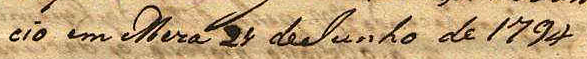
cio em Meza 24 de Iunho de 1794
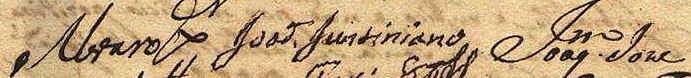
Alvaro X.er Joaõ Justiniano, Ioaq.m Ioze
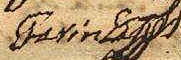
Farinha
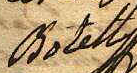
Botello
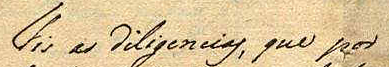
Fis as diligencias, que por
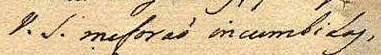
V. S. me foraõ incumbidas,
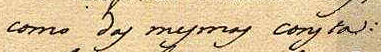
como das mesmas consta.
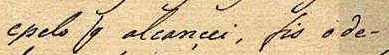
e pelo q̄ alcancei, fis o de
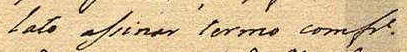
lato assinar termo comfr.e
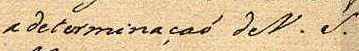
a determinaçaõ de V. S.
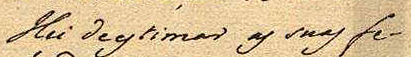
Hei de estimar as suas fe
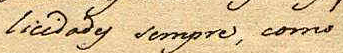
licidades sempre, como
